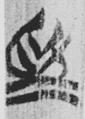爲
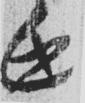臣
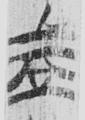者
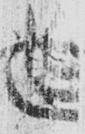必
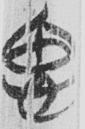思
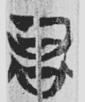君
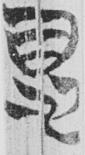○（得）
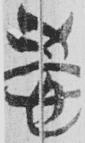志
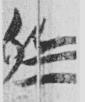於
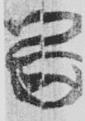○（己）
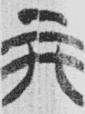而
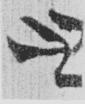又（有）
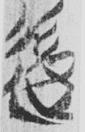○（後）
